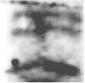王
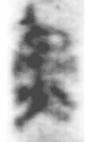魚
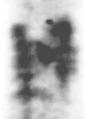軒
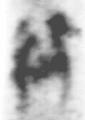紫
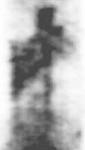○（錦）
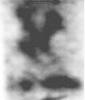之
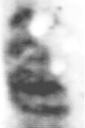裏
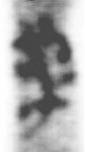革
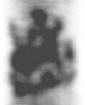兼
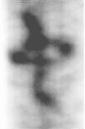屯
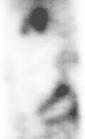○（貂）
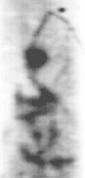定
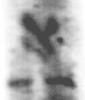之
